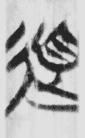道
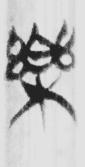樂
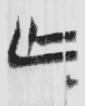亡
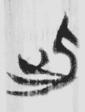此
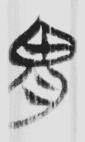胃
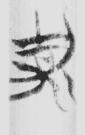劼
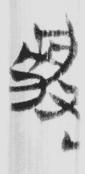{來力又}
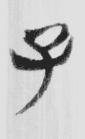子
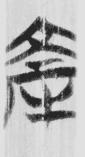產
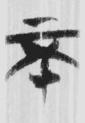不
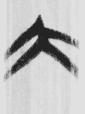大
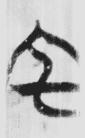宅
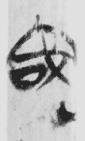{宀或}
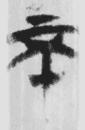不
